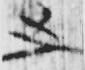之
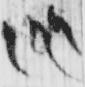州
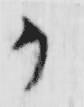人
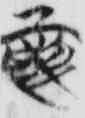婁
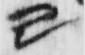己
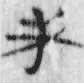未
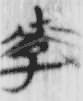李
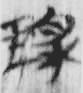瑤
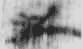之
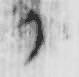人
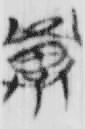畢
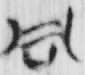同
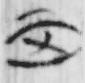正
